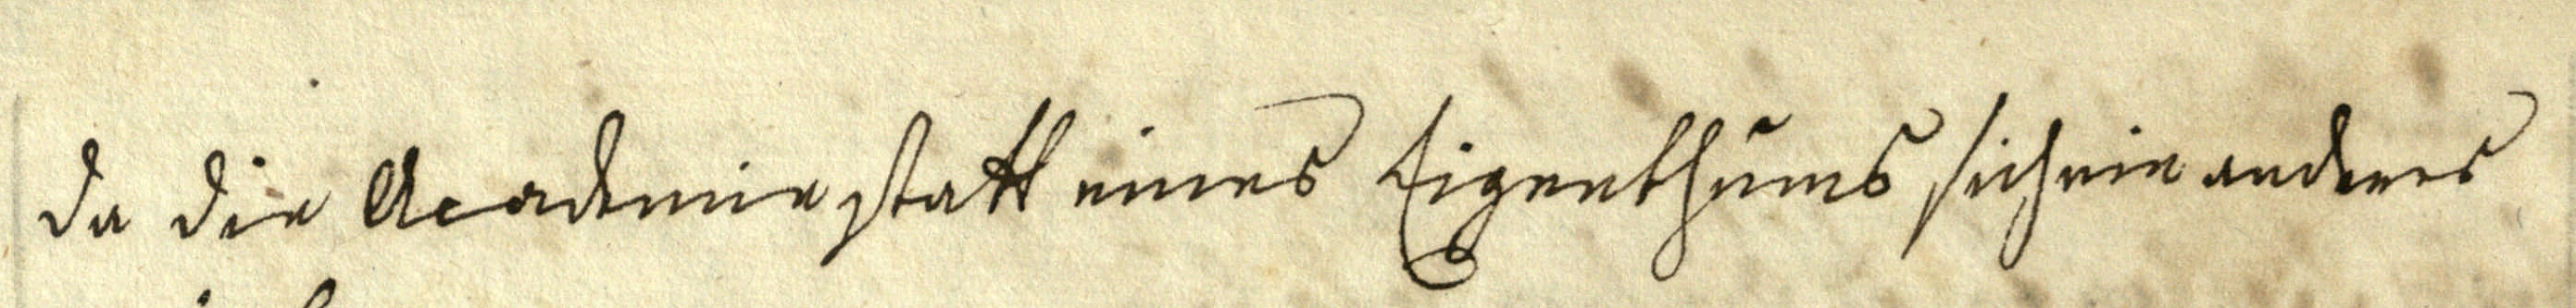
da die Academie statt eines Eigenthums sich ein anderes
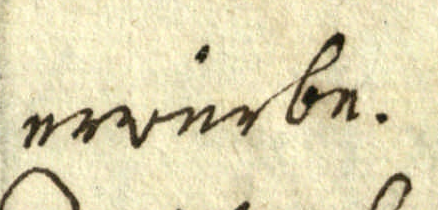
erwürbe.
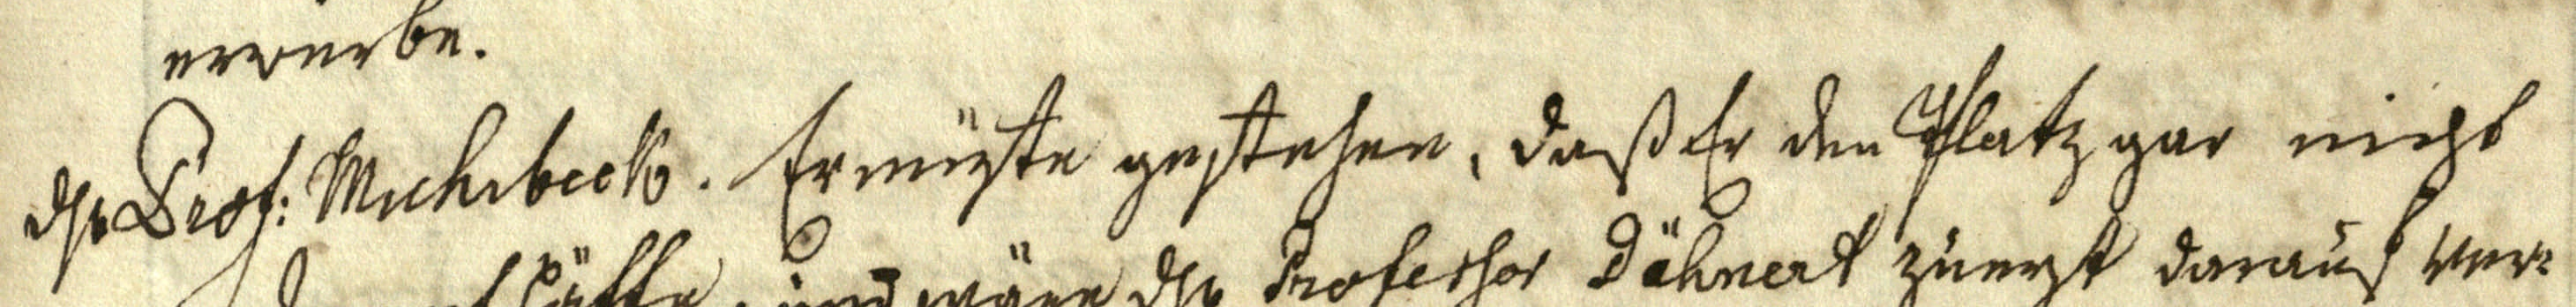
dh. Prof. Muhrbeck. Er müste gestehen, daß Er den Platz gar nicht
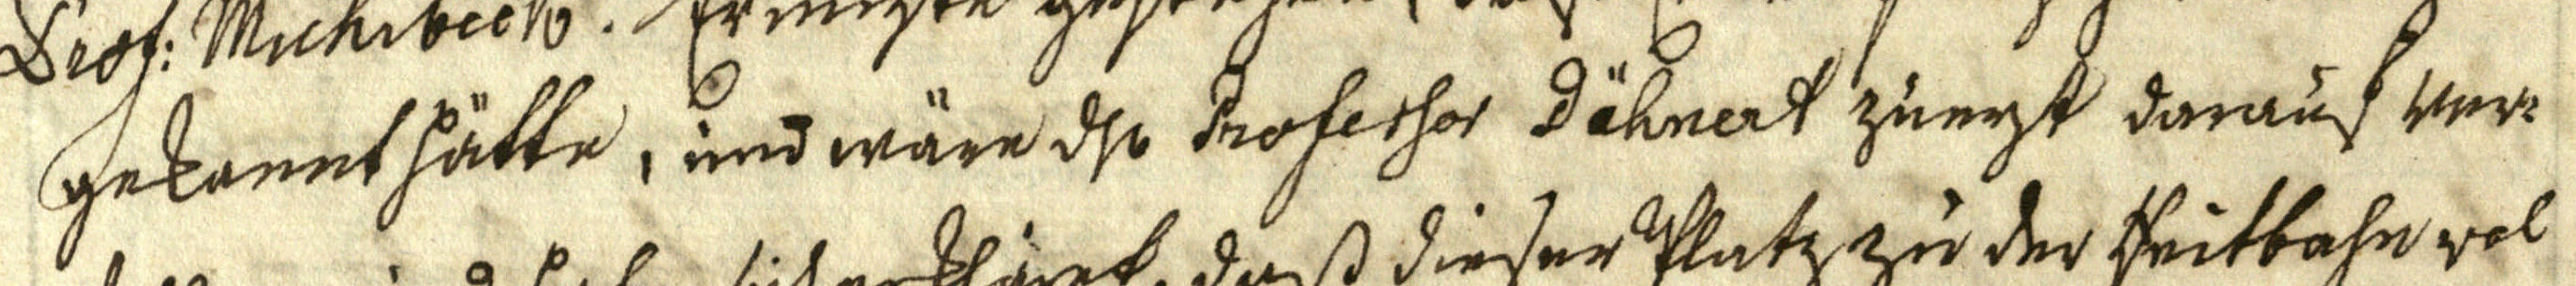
gekannt hätte, und wäre dh Professor Dähnert zuerst darauf ver¬
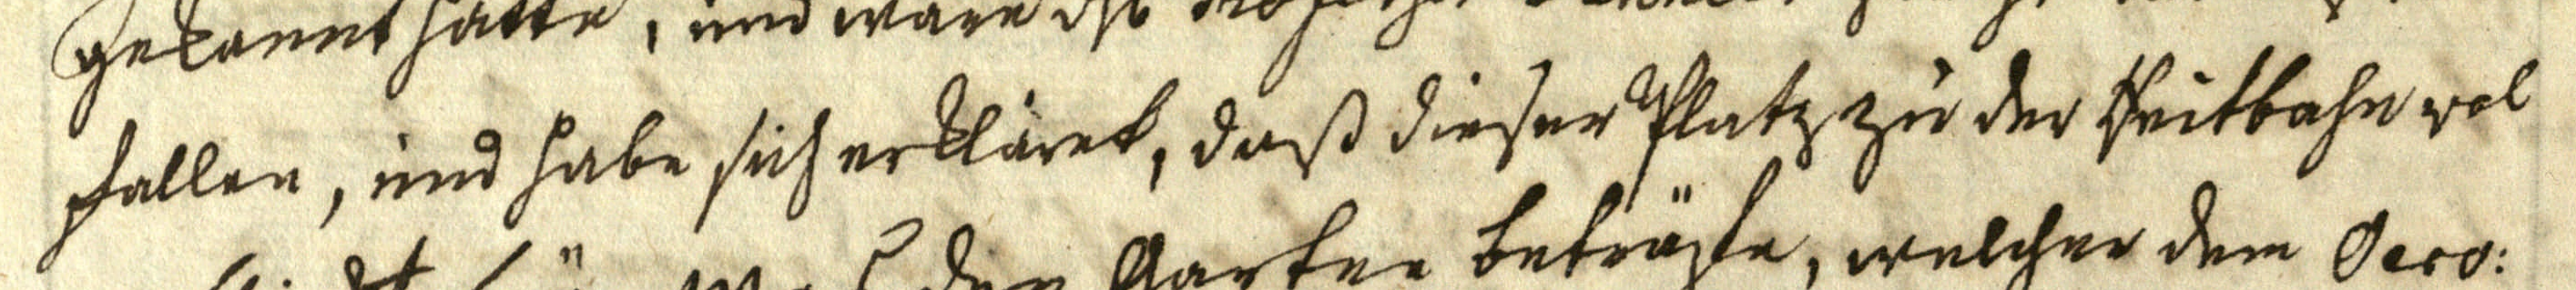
fallen, und habe sich erkläret, daß dieser Platz zu der Reitbahn wol
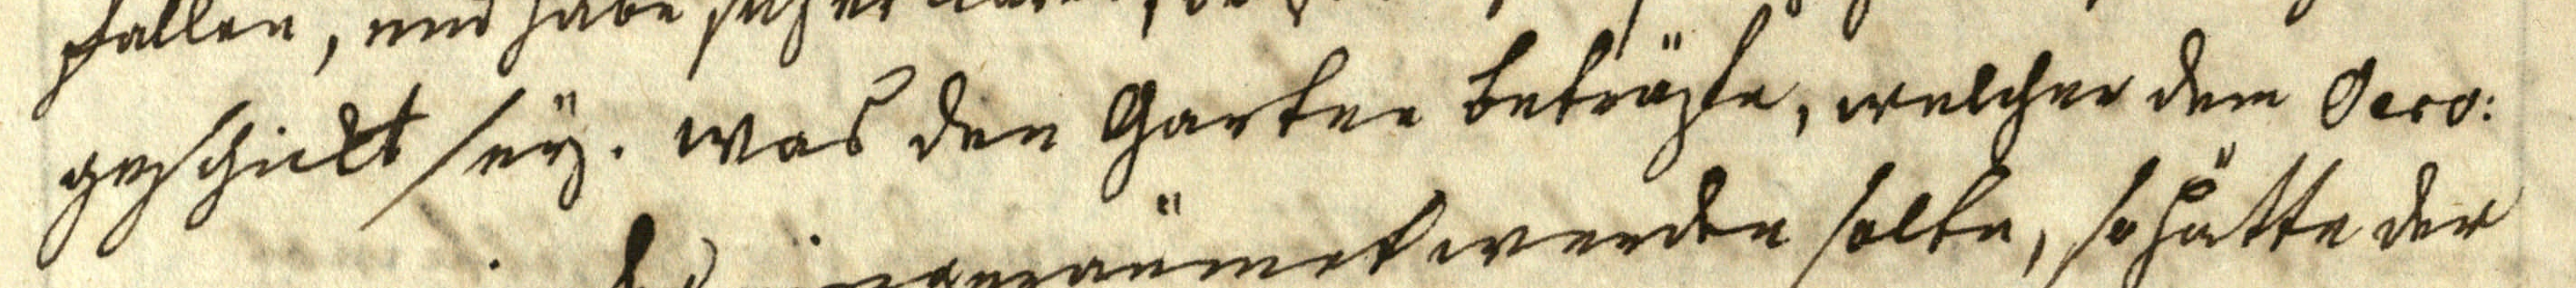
geschickt seÿ. Was den Garten beträfe, welcher dem Oeco¬
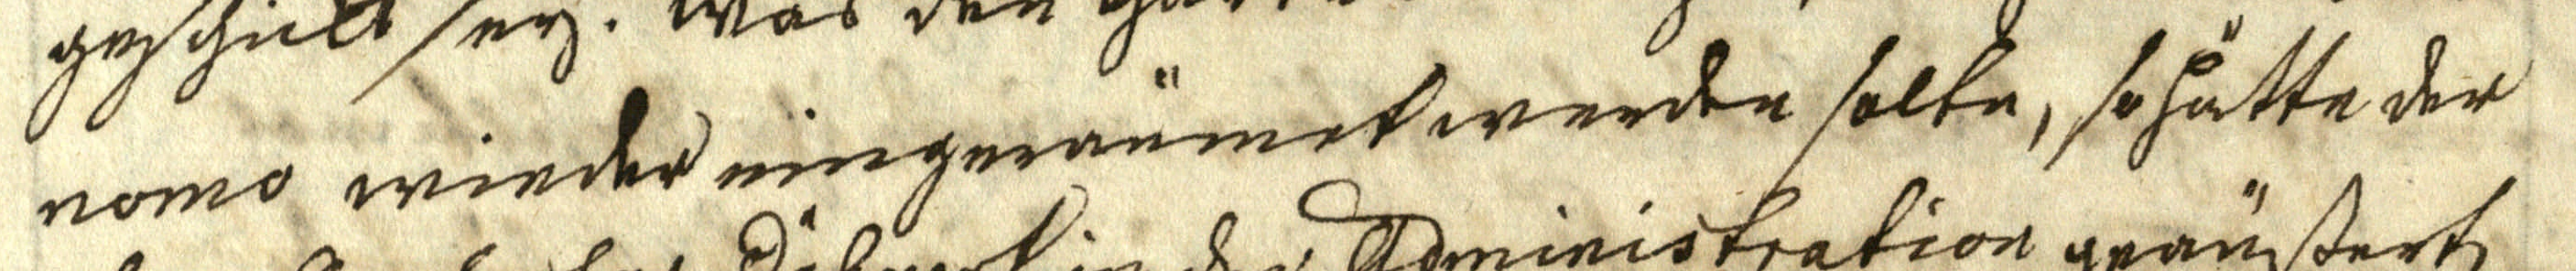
nomo wieder eingeräumet werden solte, so hätte der
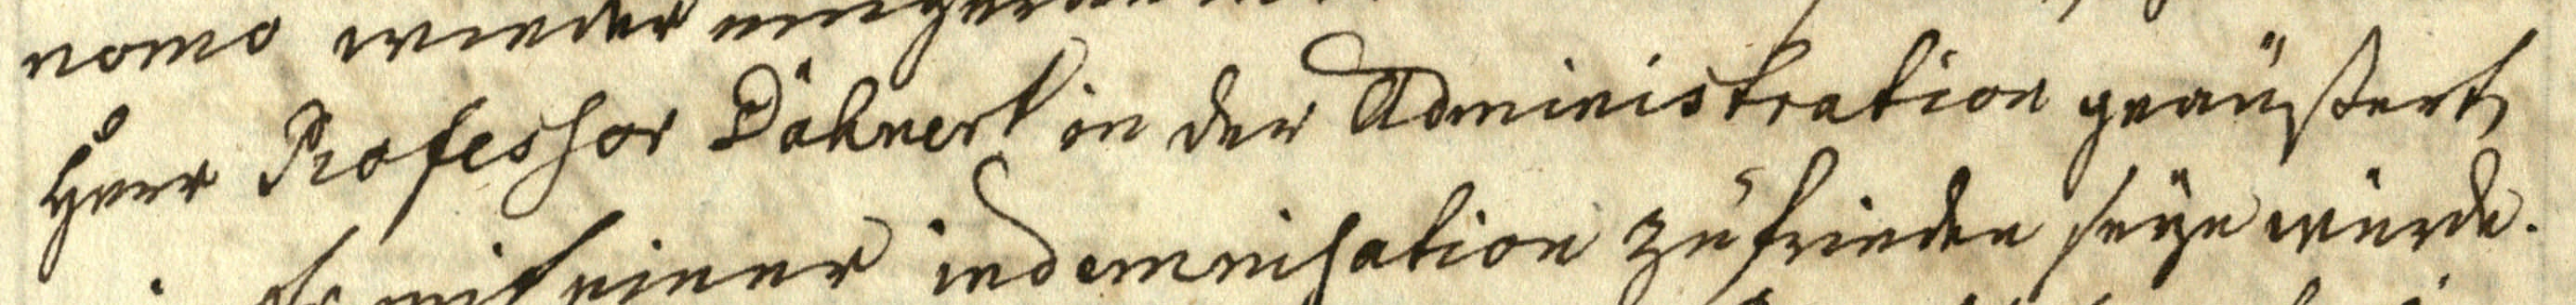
Herr Professor Dähnert in der Administration geäußert,
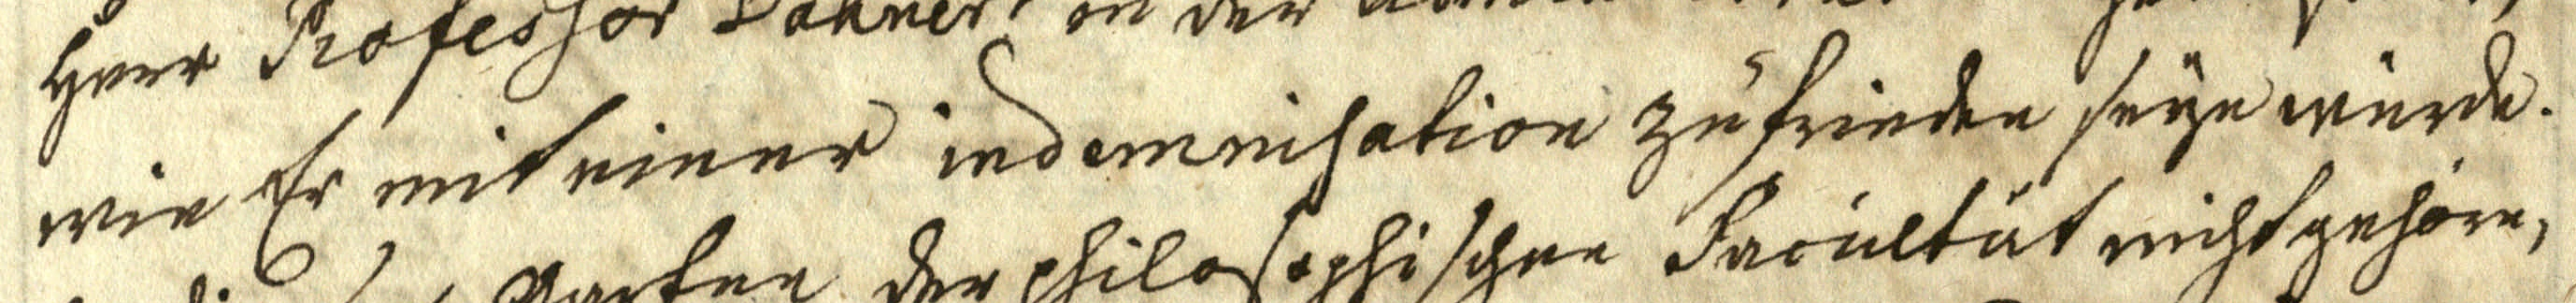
wie Er mit einer indemnisation zufrieden seÿn würde.
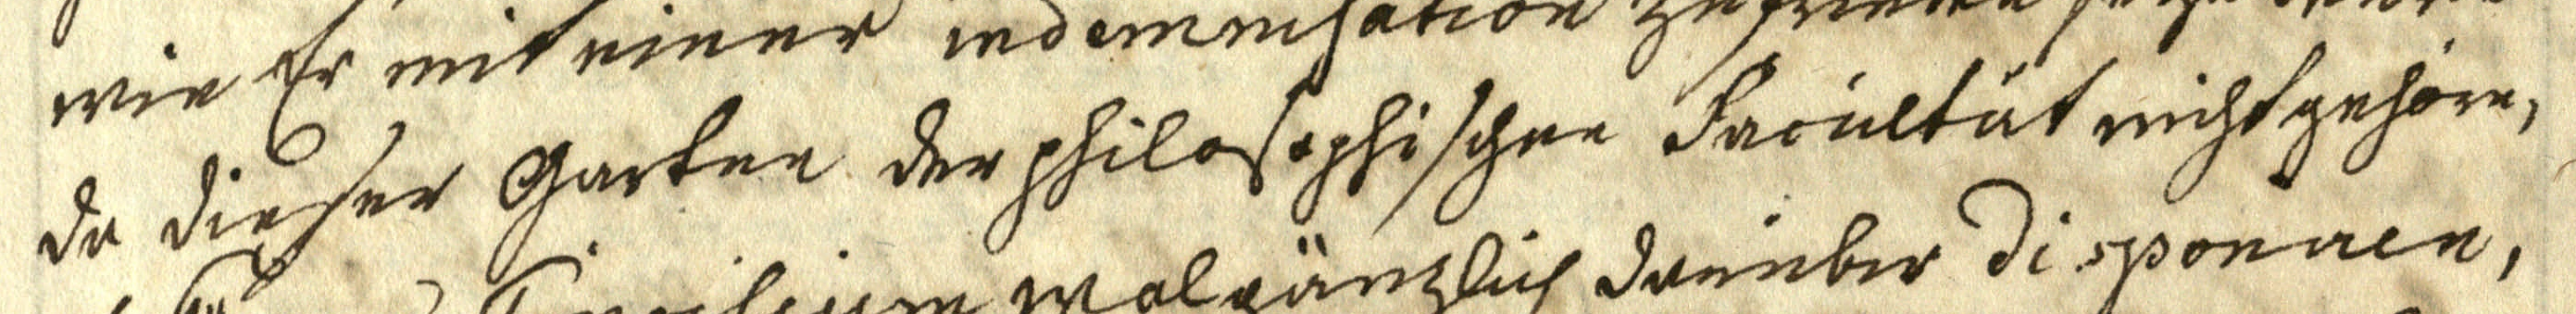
Da dieser Garten der philosophischen Facultät nicht gehöre,
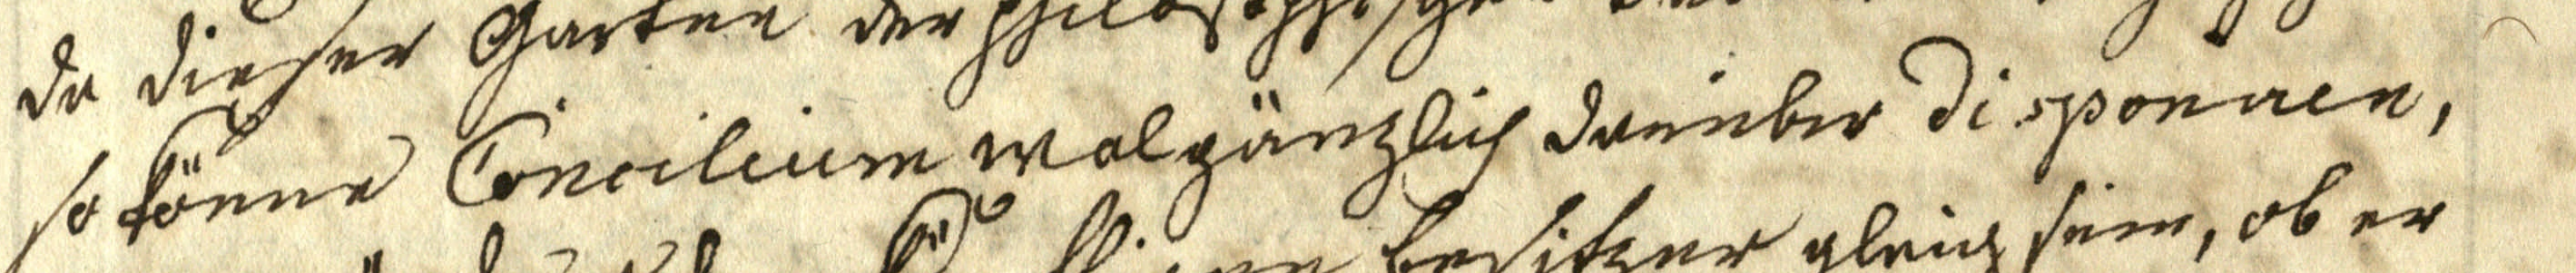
so könne Concilium wol gänzlich darüber disponiren,
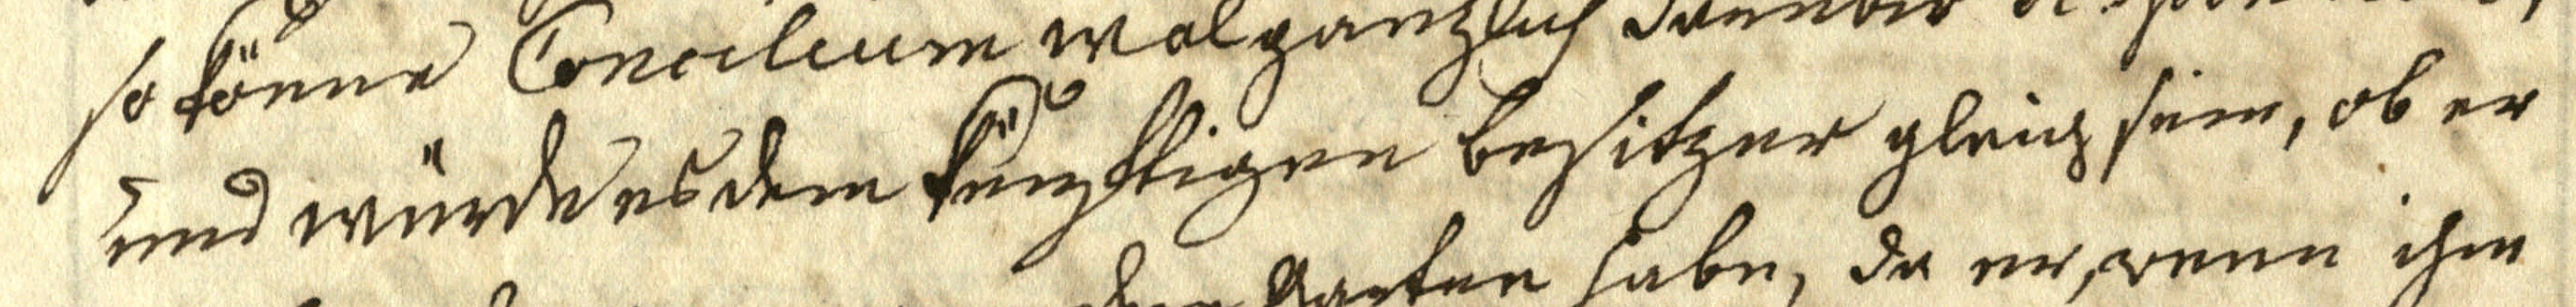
und würde es dem künftigen Besitzer gleich sein, ob er
